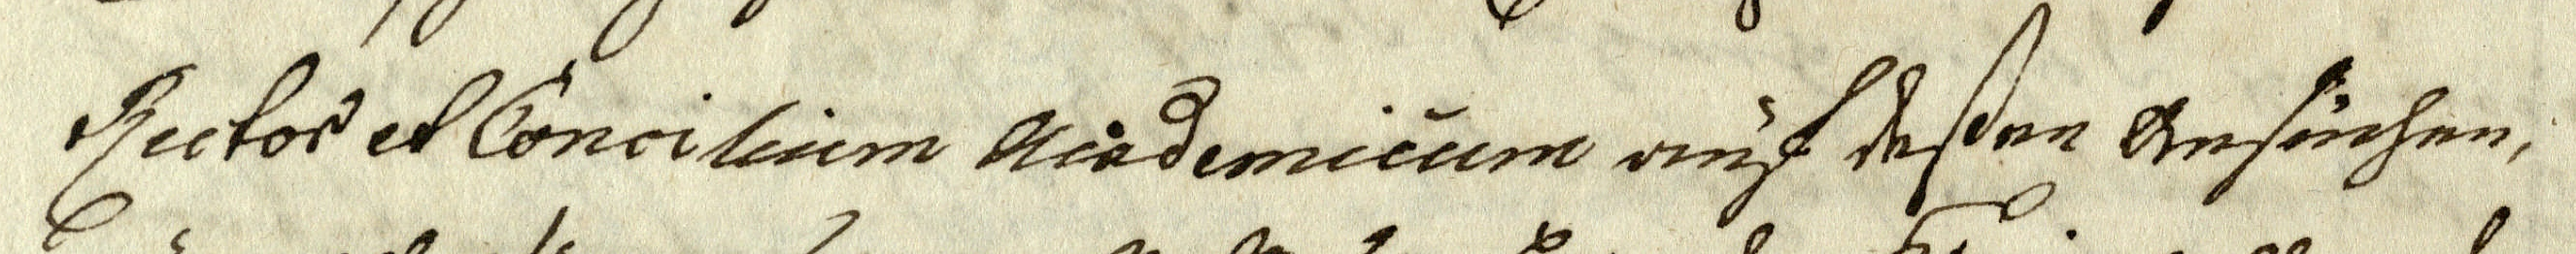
Rector et Concilium Academicum auf deßen Ansuchen,
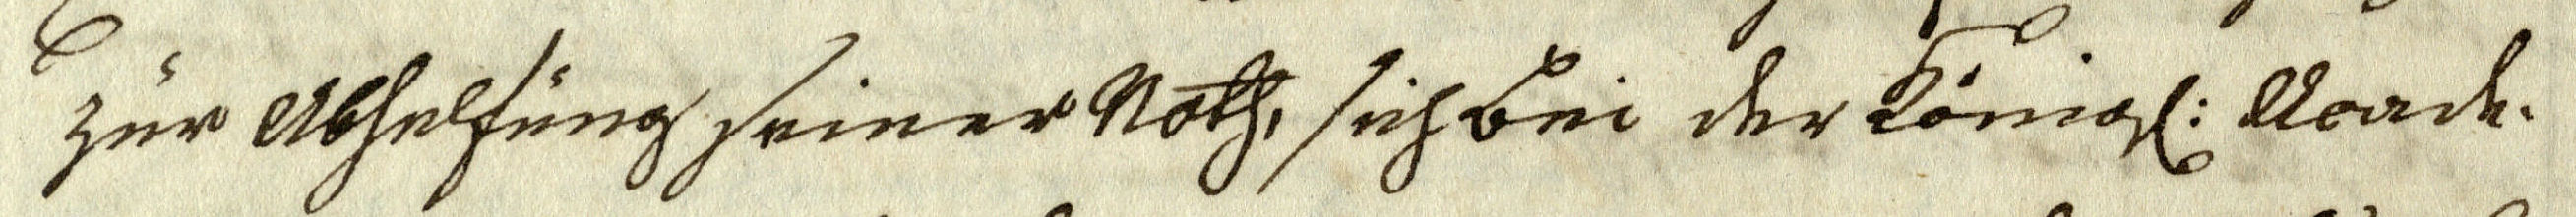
zur Abhelfung seiner Noth, sich bei der Königl. Acade¬
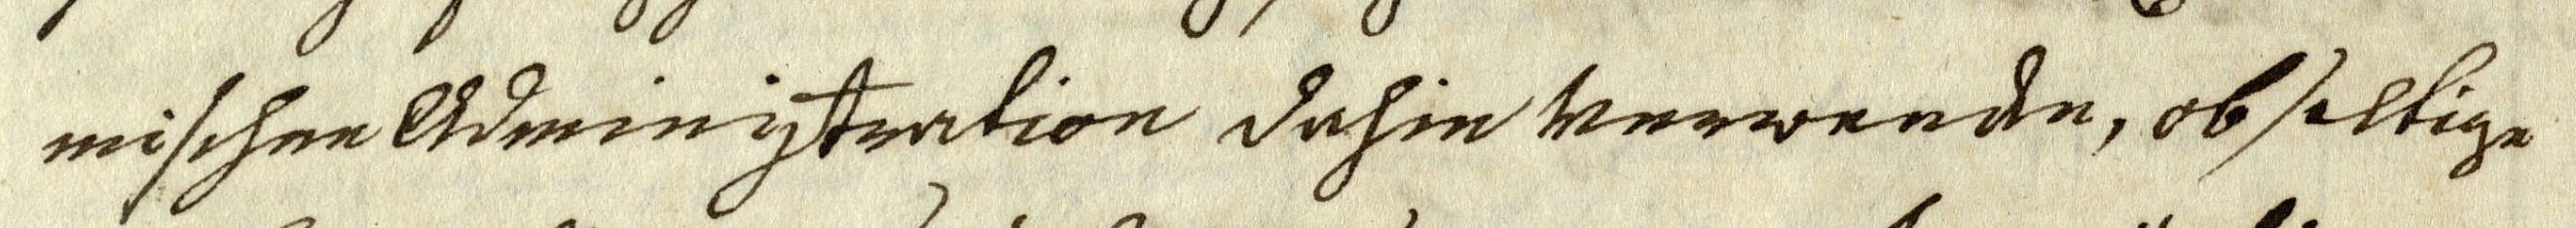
mischen Administration dahin verwenden, ob selbige
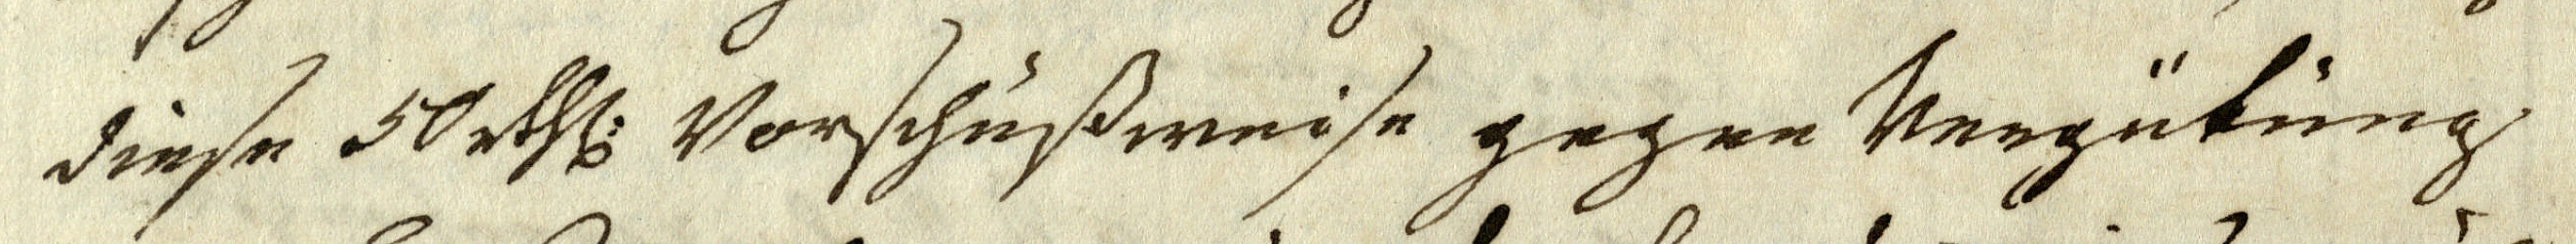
diese 50 rth. voschußweise gegen Vergütung
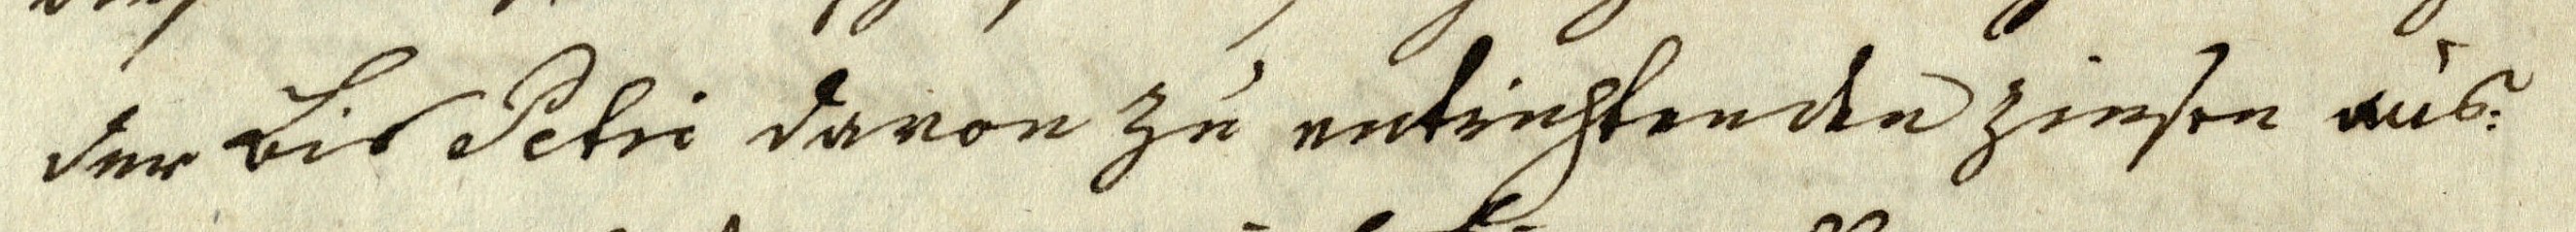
der bis Petri davon zu entrichtenden Zinsen aus¬
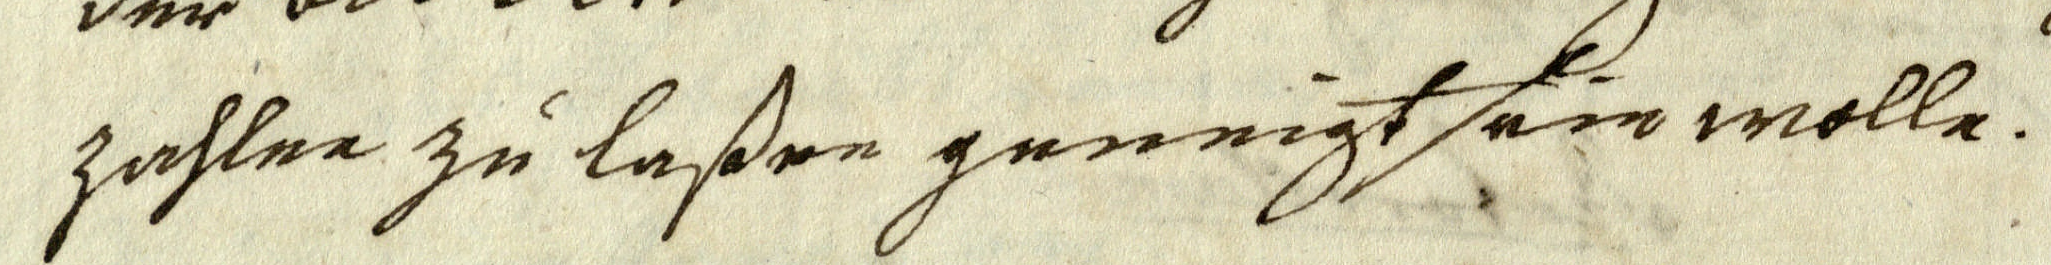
zahlen zu laßen geneigt sein wolle.
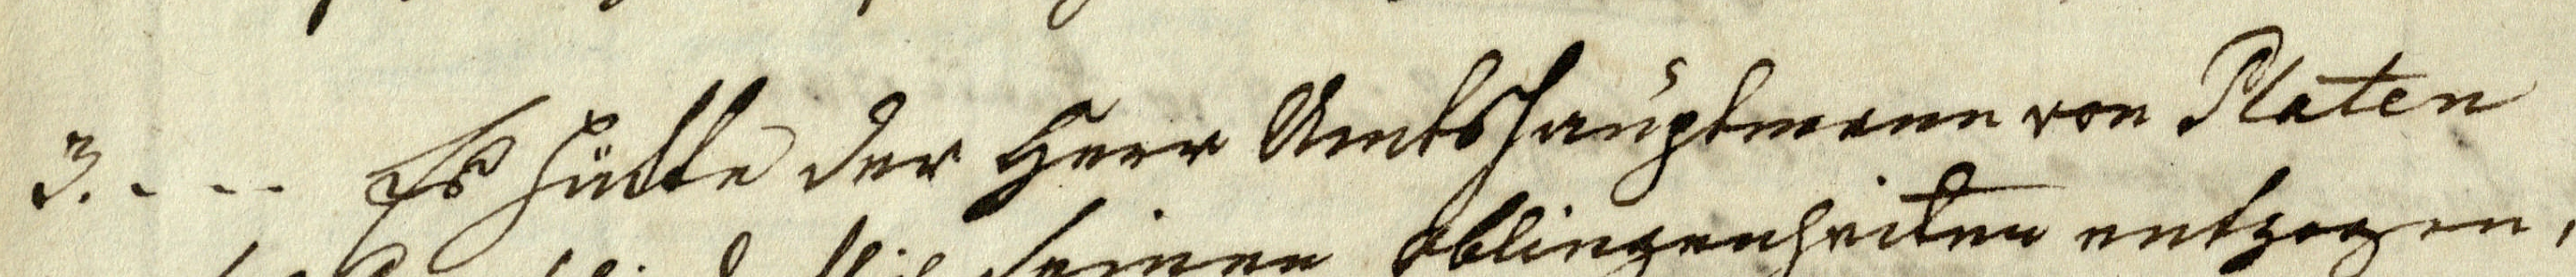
3. Es hätte der Herr Amtshauptmann von Platen
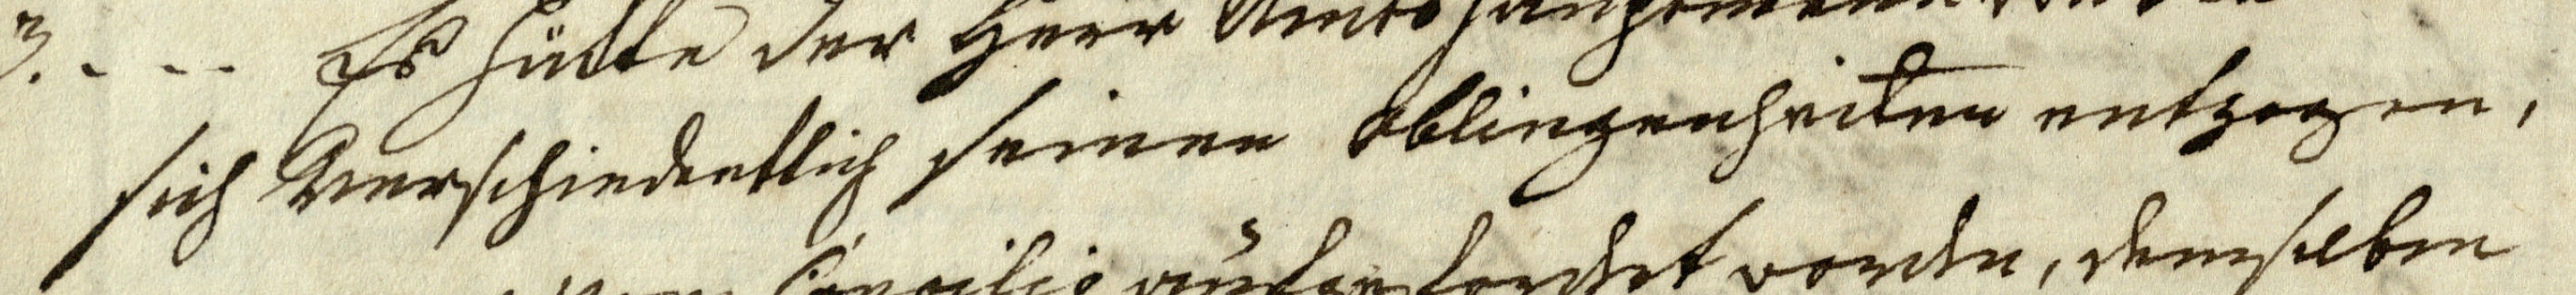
sich verschiedentlich seinen Obliegenheiten entzogen,
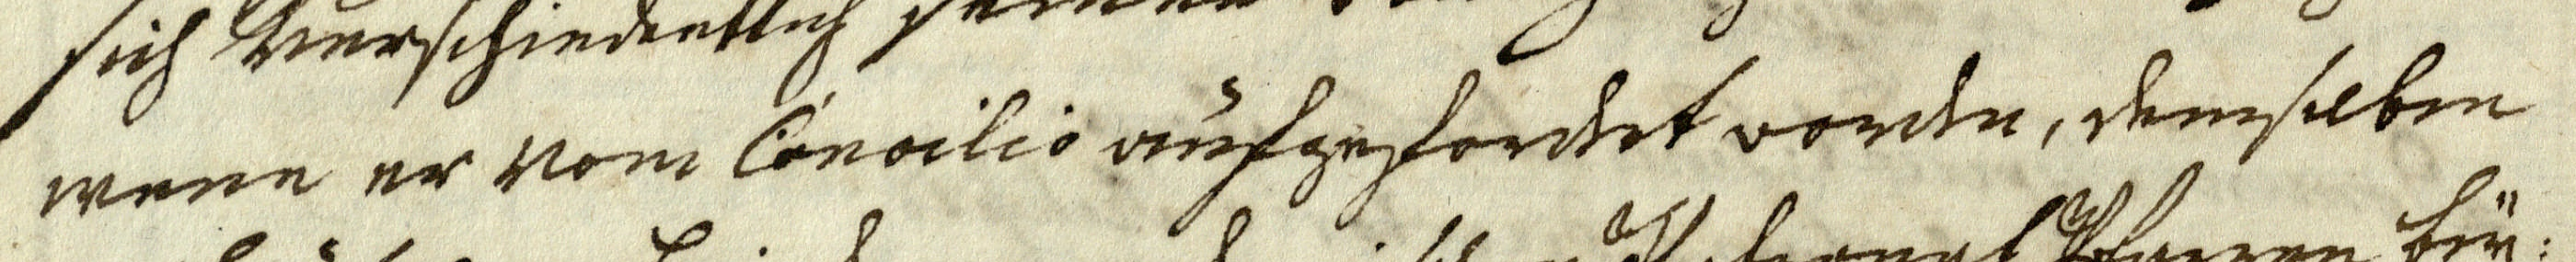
wenn er vom Concilio aufgefordert worden, demselben
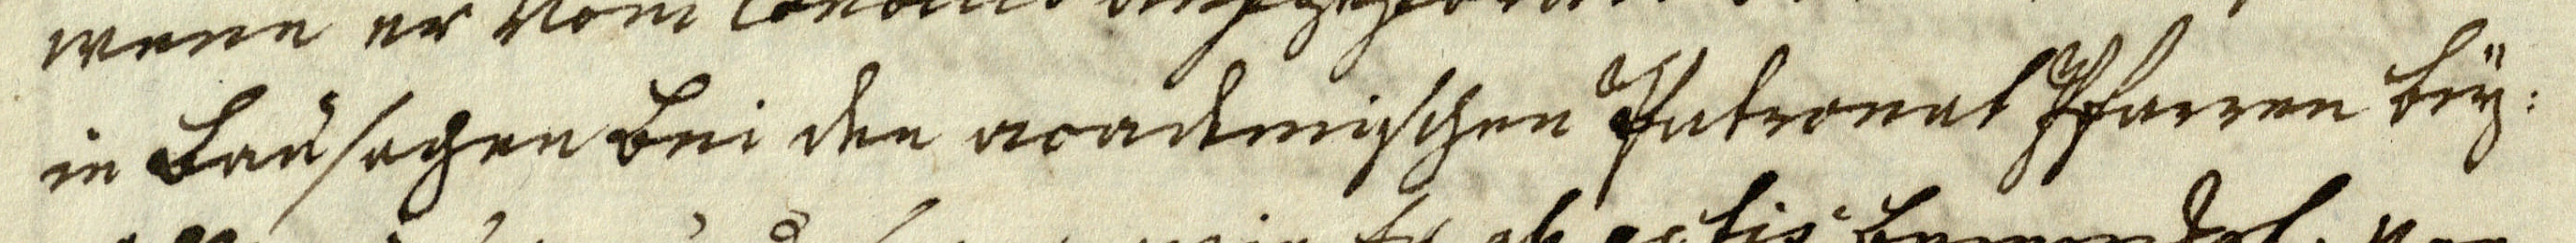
in Bausachen bei den academischen Patronat Pfarren beÿ¬
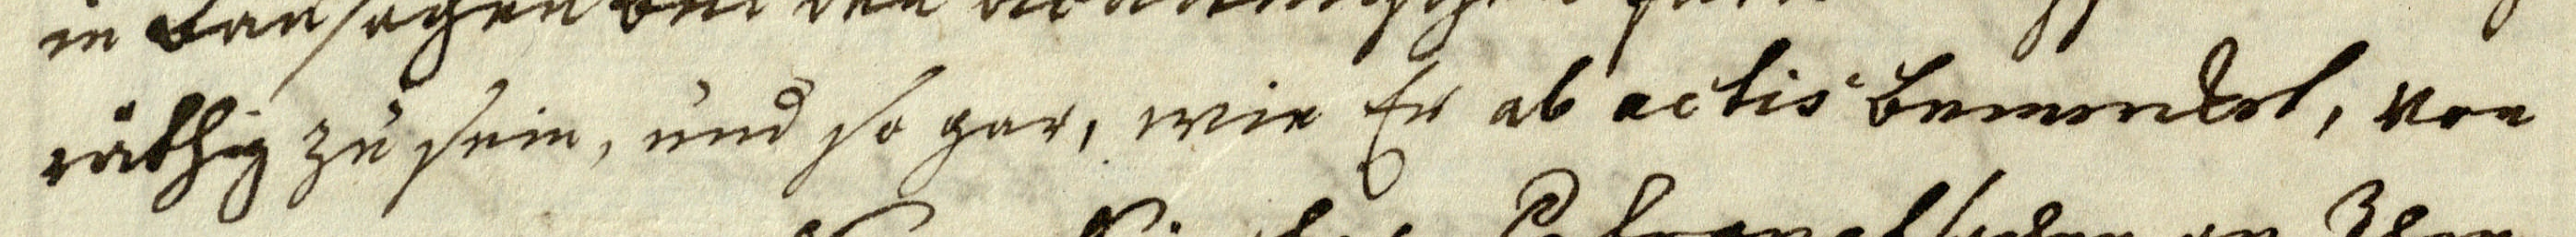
räthig zu sein, und so gar, wie Er ab actis bemercket, von
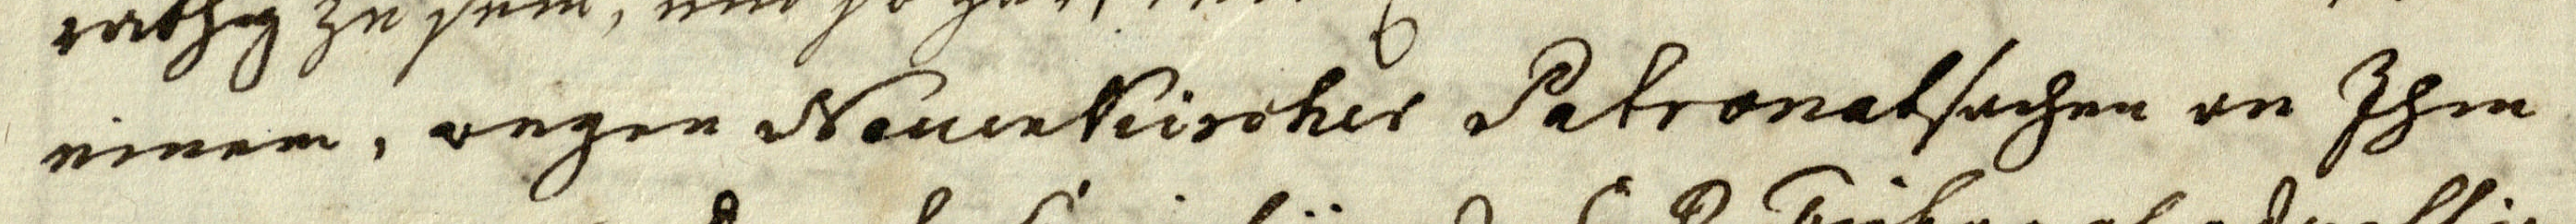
einem, wegenNeuenkircher Patronatsachen an Ihm
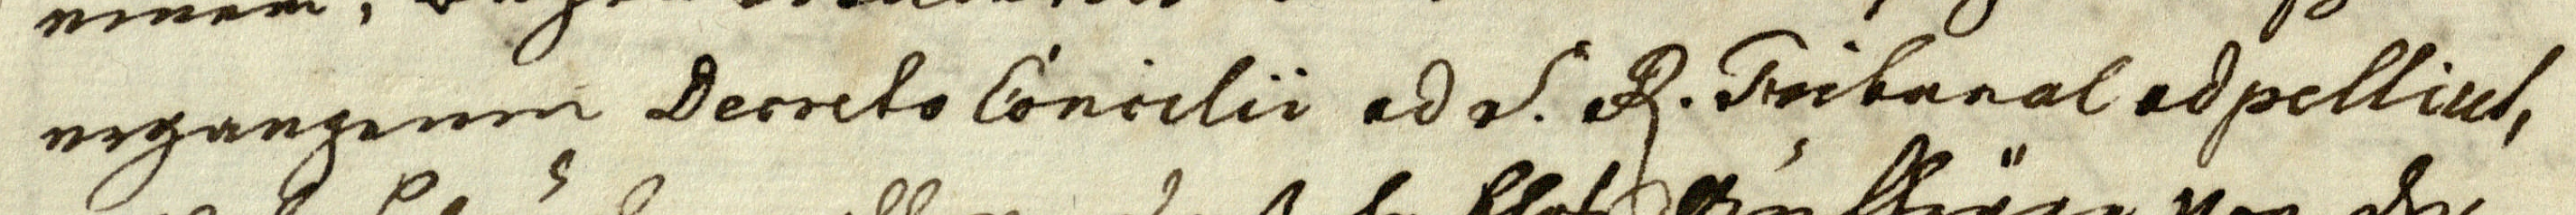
ergangenen Decreto Concilii ad S. R. Tribunal adpelliret,
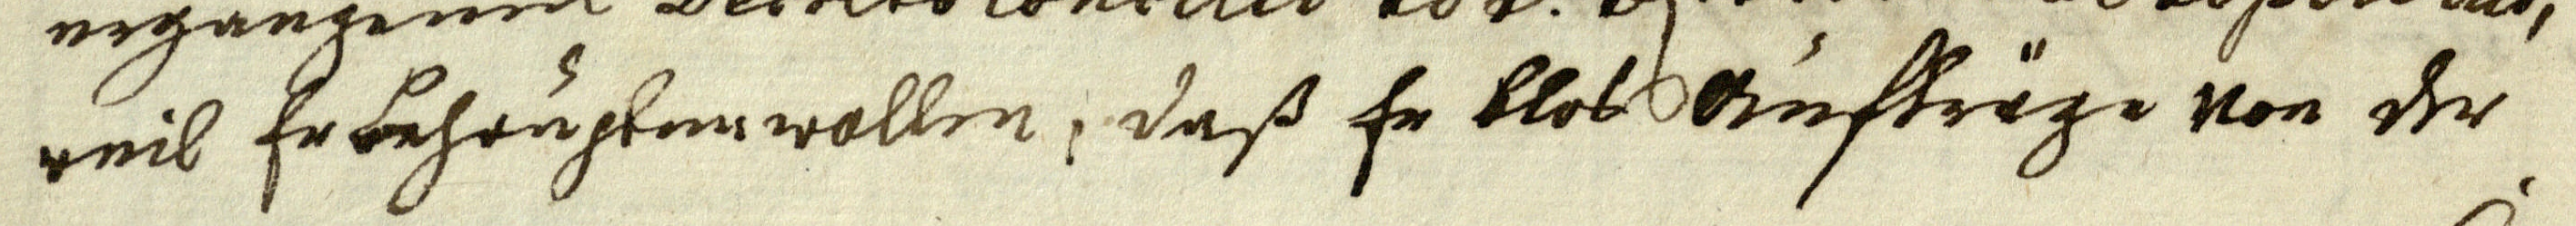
weil Er behaupten wollen, daß Er blos Aufträge von der
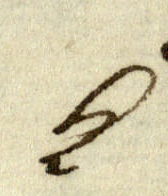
K
